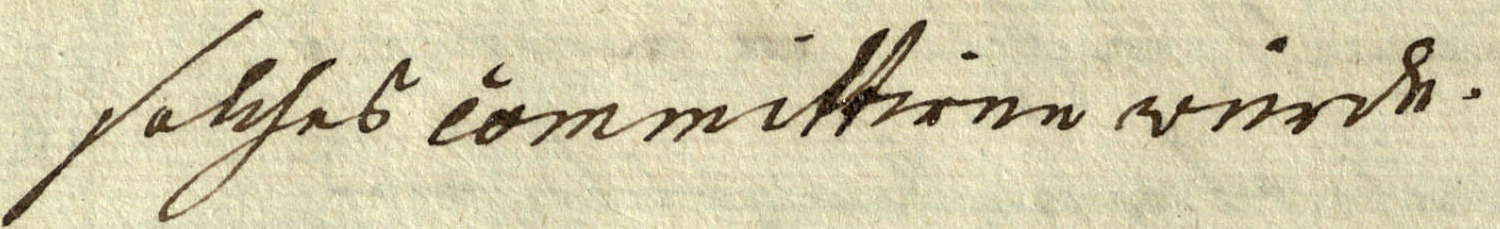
solches committiren würde.
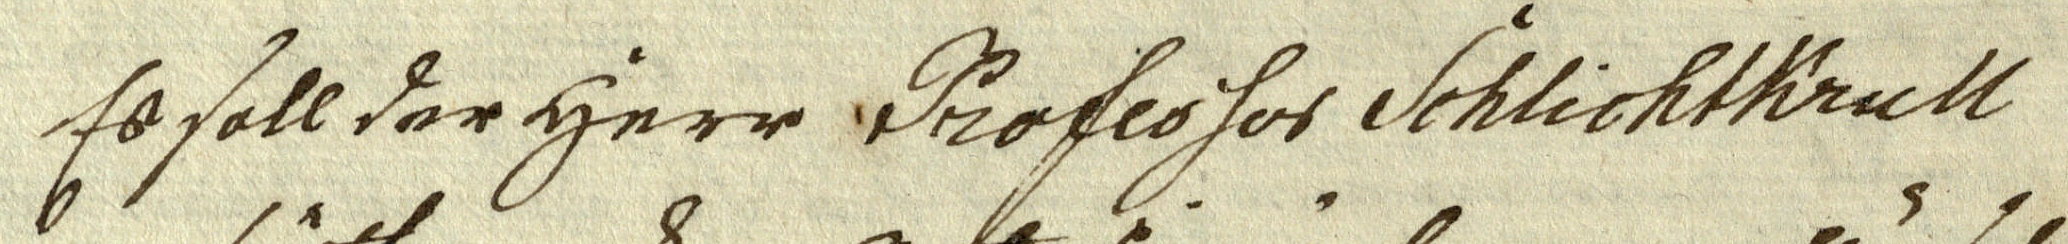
Es soll der Herr Professor Schlichtkrull
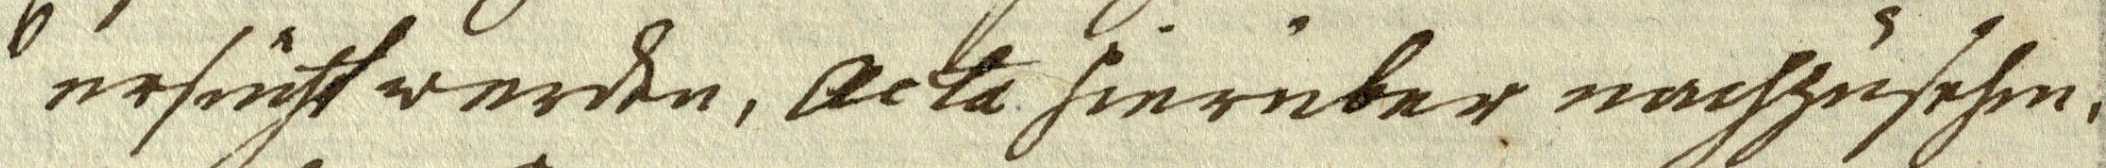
ersucht werden, Acta hierüber nachzusehen,
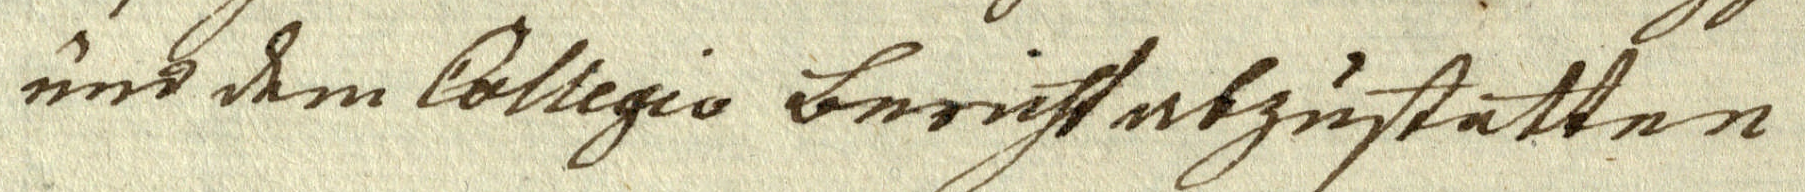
und dem Collegio Bericht abzustatten.
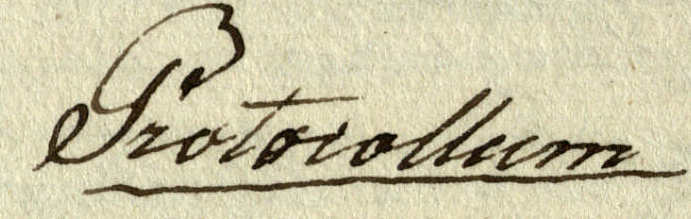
Protocollum
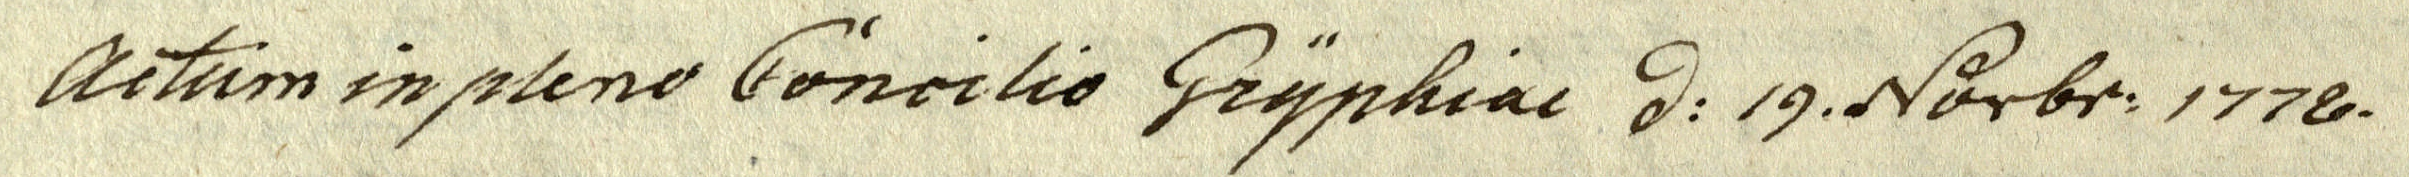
Actum in pleno Concilio Grÿphiae d. 19. Novbr. 1778
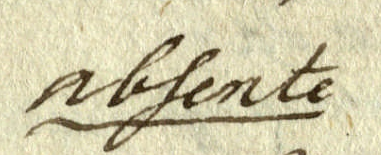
absente
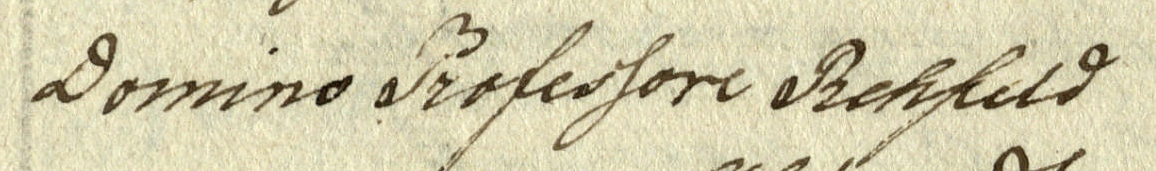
Domino Professore Rehfeld
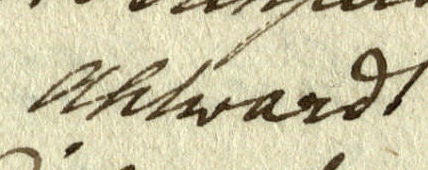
Ahlwardt
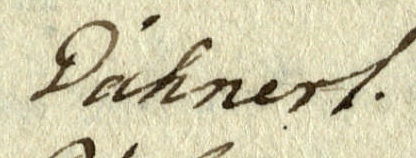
Dähnert
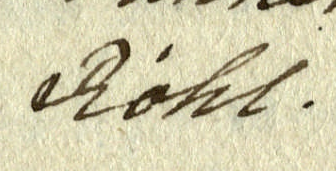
Röhl.
